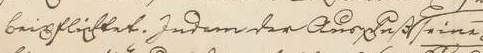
beipflichtet. Indem der Ausschuß keinen
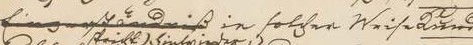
Einverständniß in solcher Weise Kund
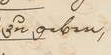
zu geben,
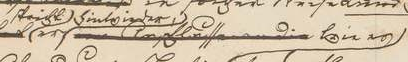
spricht er im Anschlusse an diehinwieder,
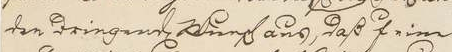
den dringenden Wunsch aus, daß auf eine
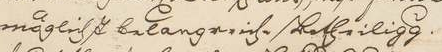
möglichst belangreiche Betheiligg.
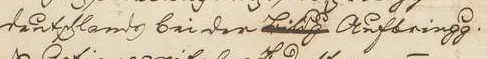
Deutschlands bei der Bildg. Aufbringg.
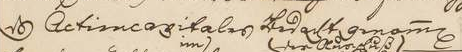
des Actiencapitales Bedacht genommen
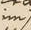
werden
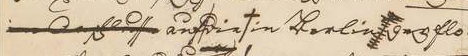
auf diett hierüber in Berlin gepflo-
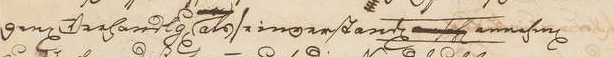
Verhandlungen es als//beiderseitig einverstanden ansehen annehmen
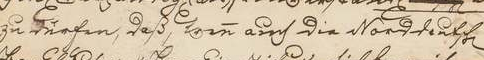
zu dürfen, daß, wenn auch die Norddeutschen
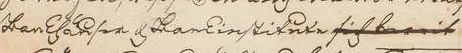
Bankhäuser & Bankinstitute sich bereit
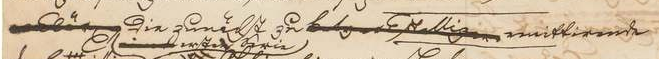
erklären, die zunächst zu bewerkstelligen-emittirende
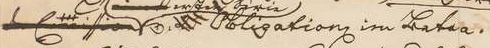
einer ersten Serie v. 25 Obligationen im Betra-
